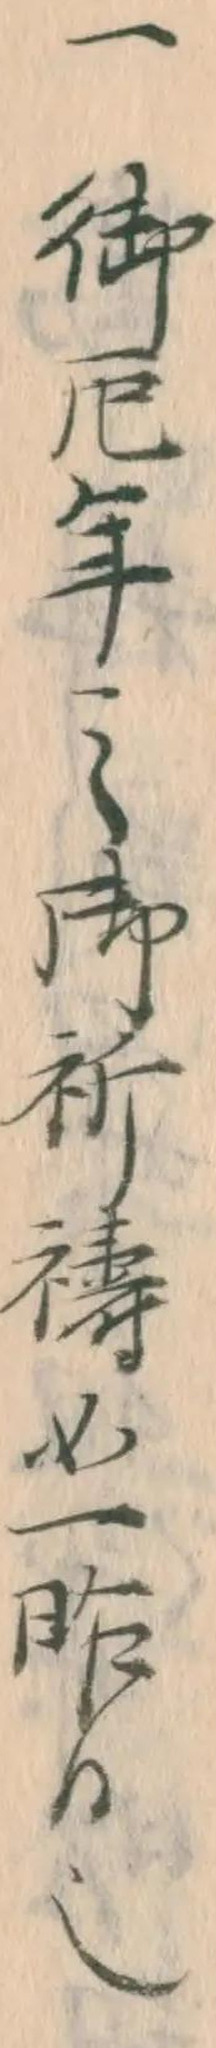一御厄年之御祈祷如一昨日也
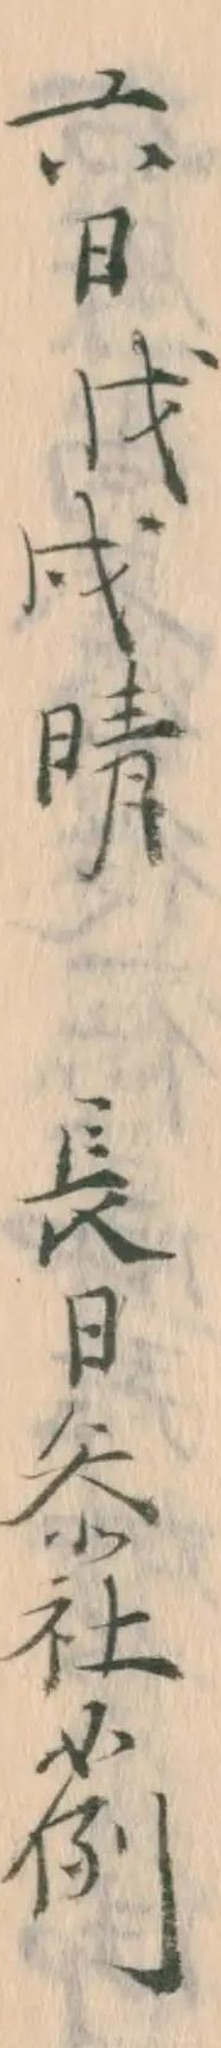六日戊戌晴長日参社如例
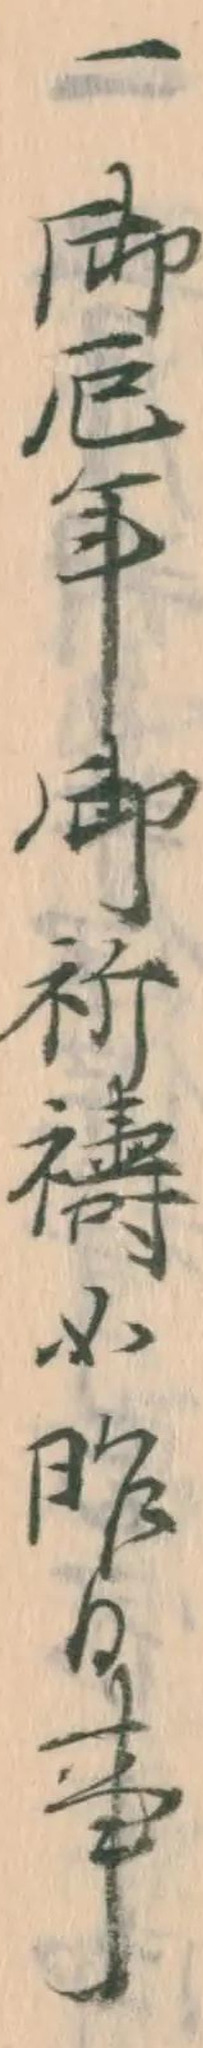一御厄年御祈祷如昨日事
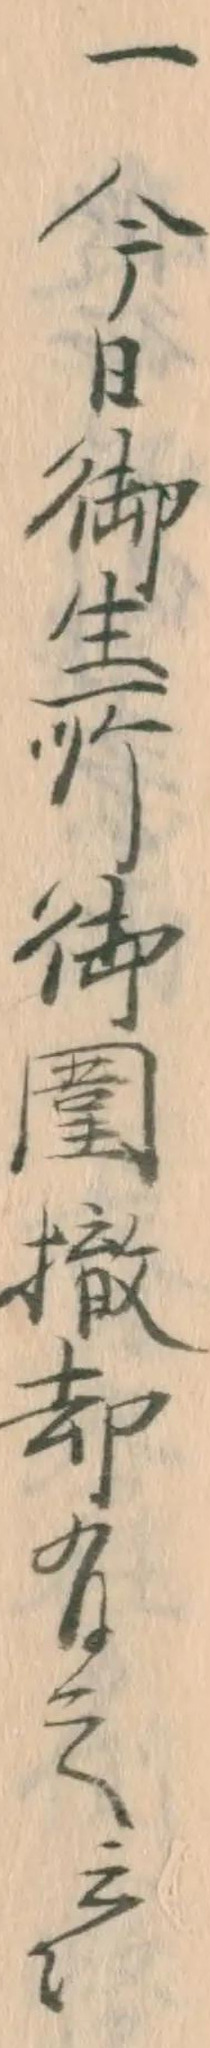一今日御生所御圍撤却有之云々
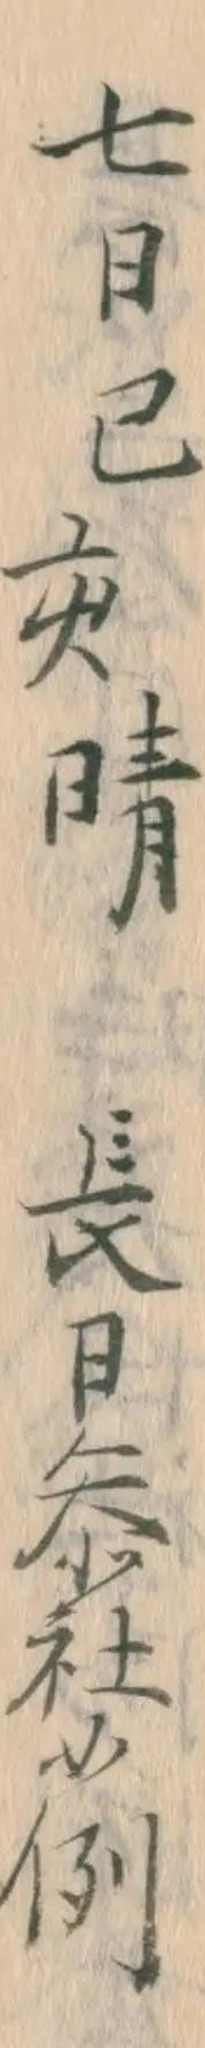七日己亥晴長日参社如例
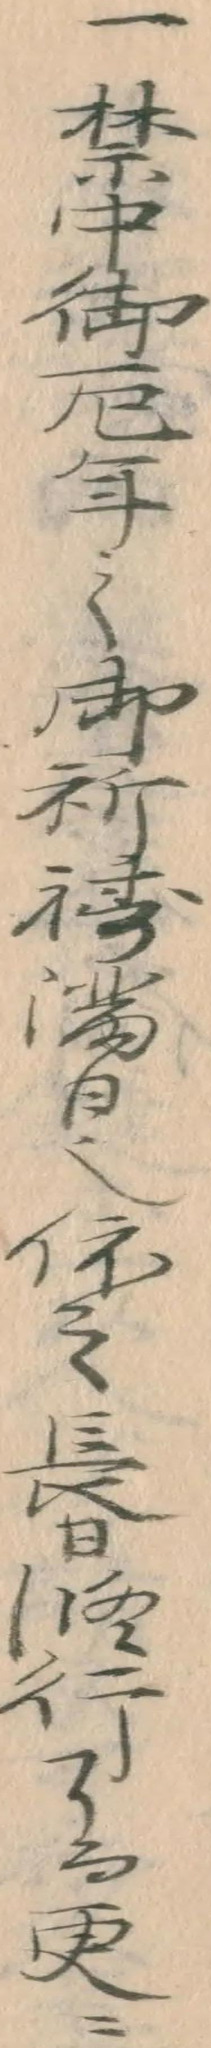一禁中御厄年之御祈祷満日也依之長日修行了而更ニ
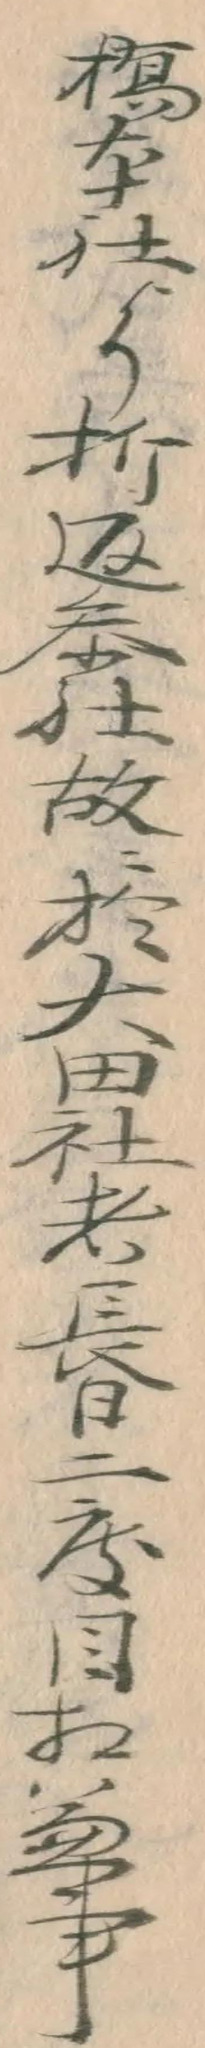橋本社より折返参社故ニ於大田社者長長月二度目相兼事
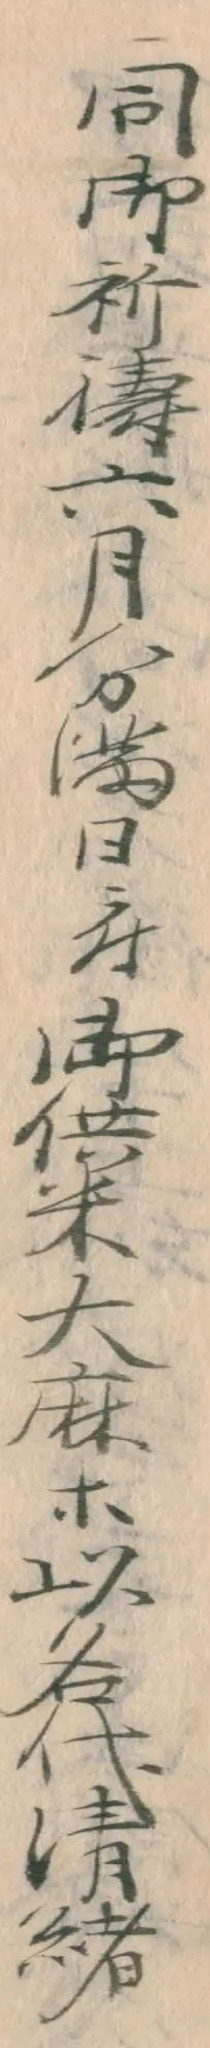一同御祈祷六月分満日ニ付御供米大麻等以名代清緒
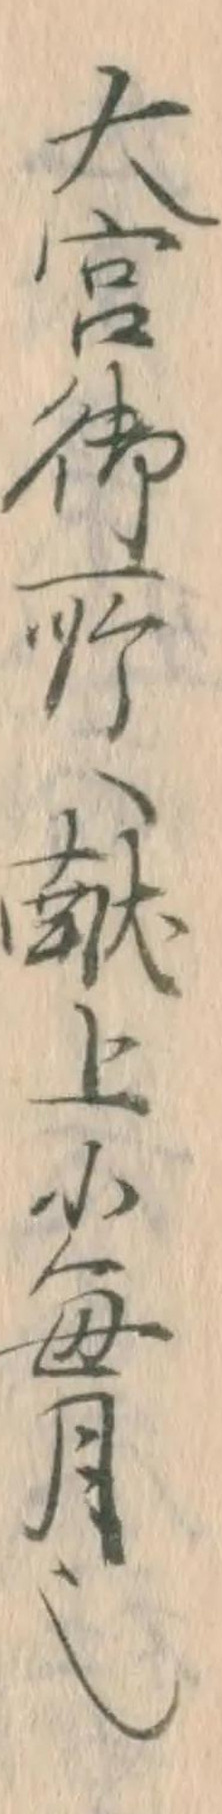大宮御所へ献上小毎月也
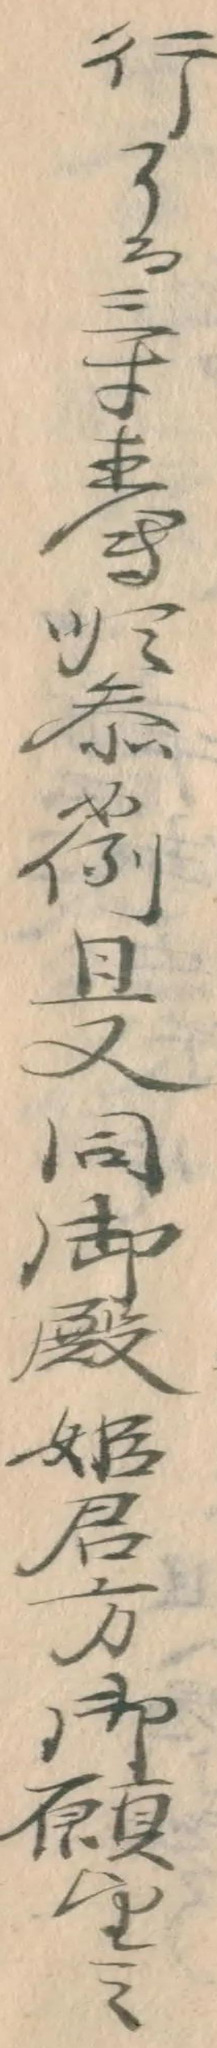行了而三寸直會順参如例且又同御殿姫君方御願望之
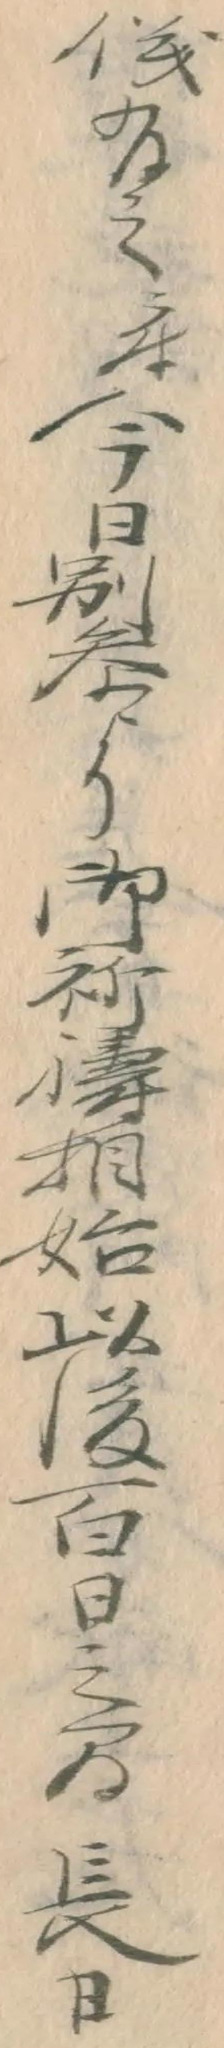儀有之ニ付今日別参より御祈祷相始以後百日之間長日

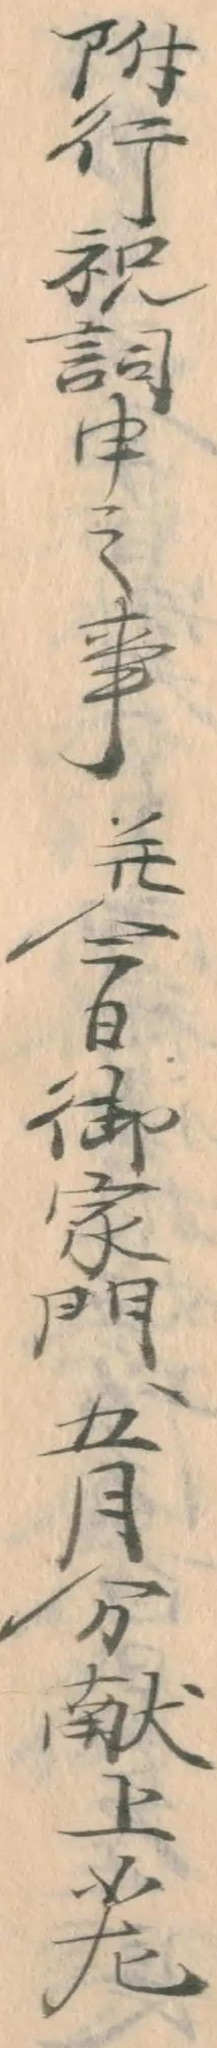附行祝詞申之事并今日御家門ヘ五月分献上如左
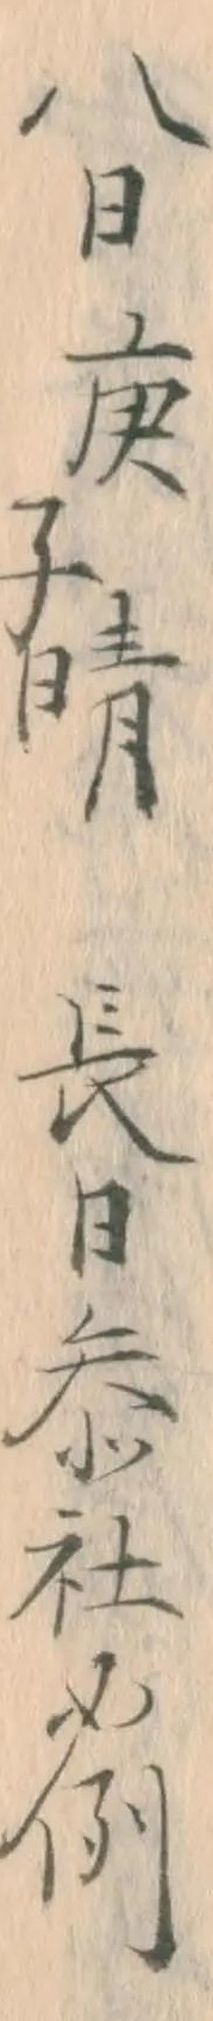八日庚子晴長日参社如例
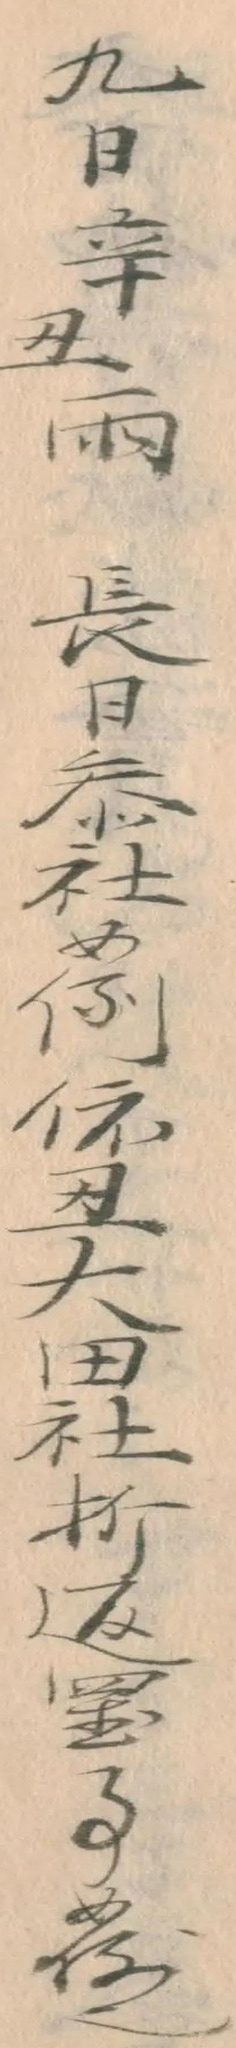九日辛丑雨長日参社如例依丑大田社折返置事如例也
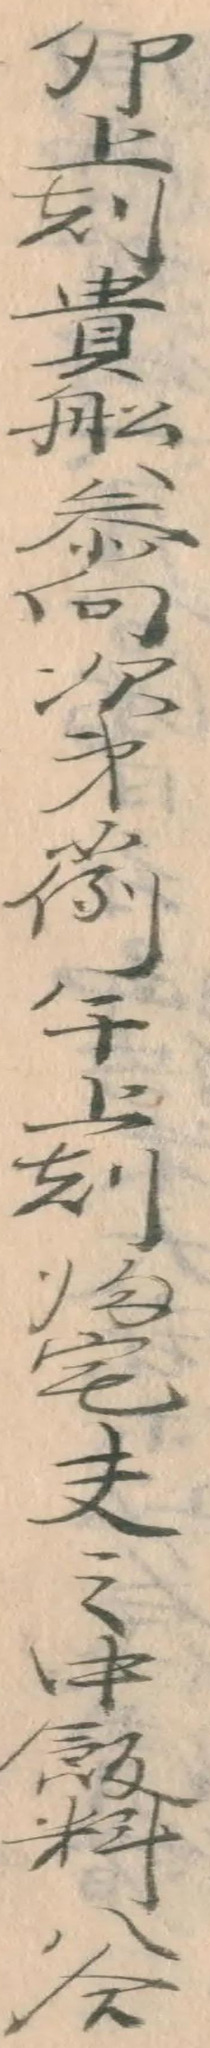一卯上刻貴船へ参向次第如例依午上刻帰宅夫之中飯料八合
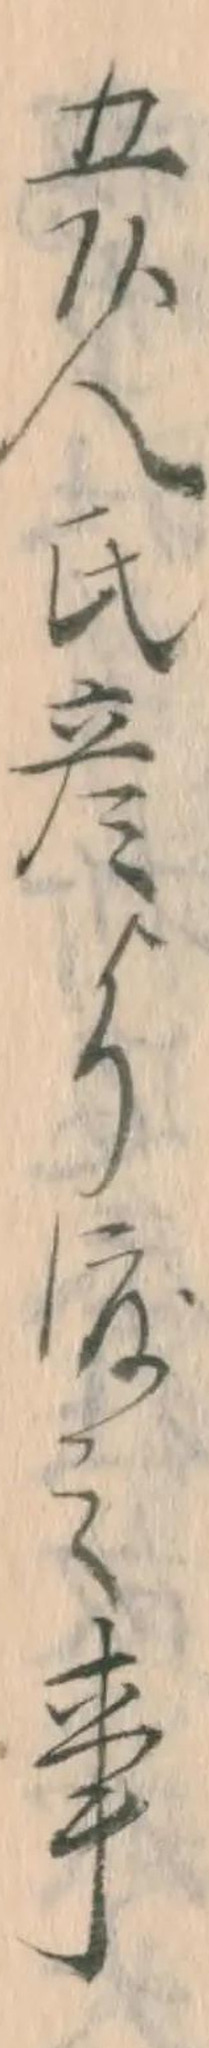五頭人氏彦より渡之事
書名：賀茂社記録. 第73冊
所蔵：国立国会図書館 National Diet Library, JAPAN
